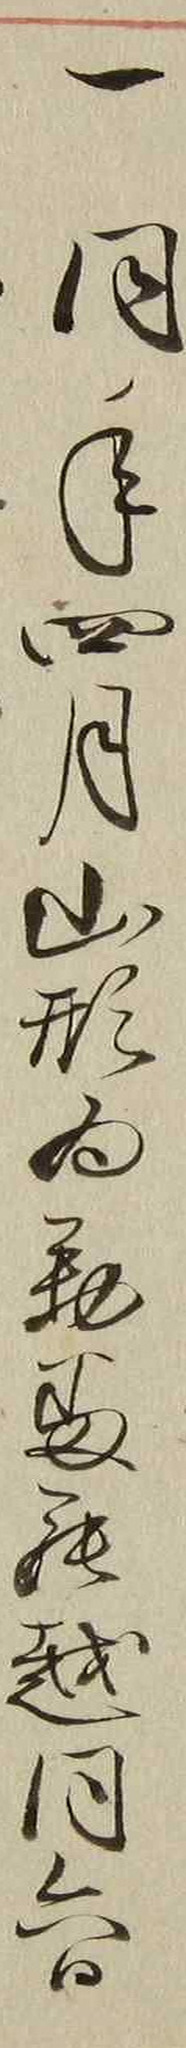一同年四月山形為勤番罷越同六日
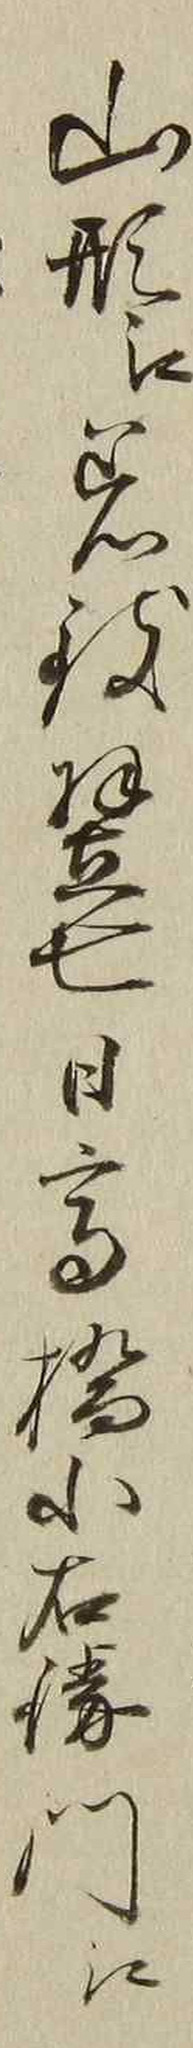山形江着致翌七日高橋小右講門江
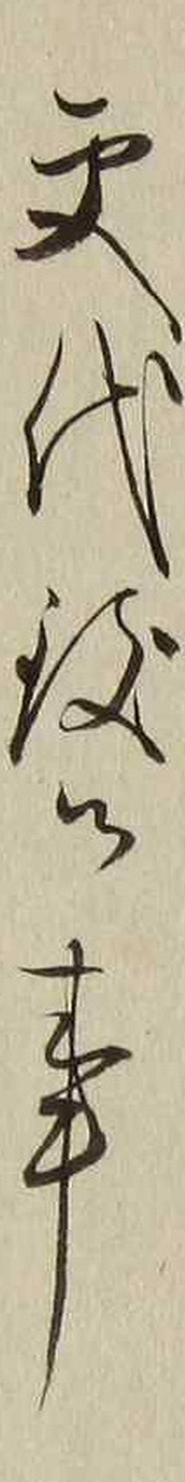更代致候事
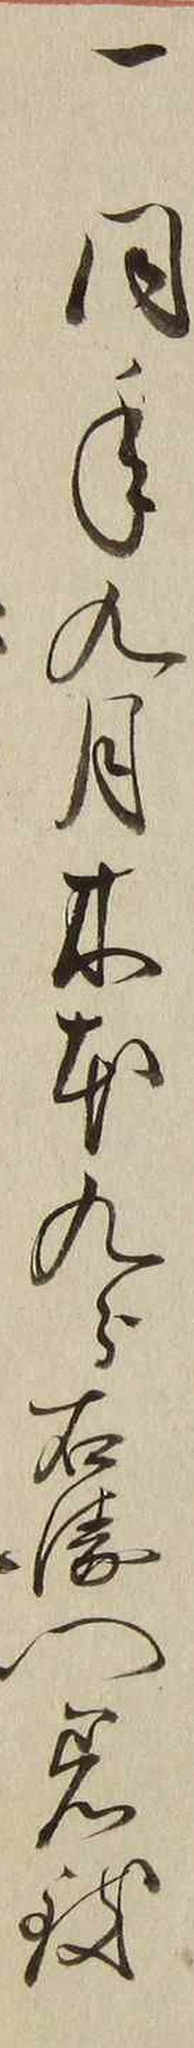一同手九月木本九郎右衛門着致
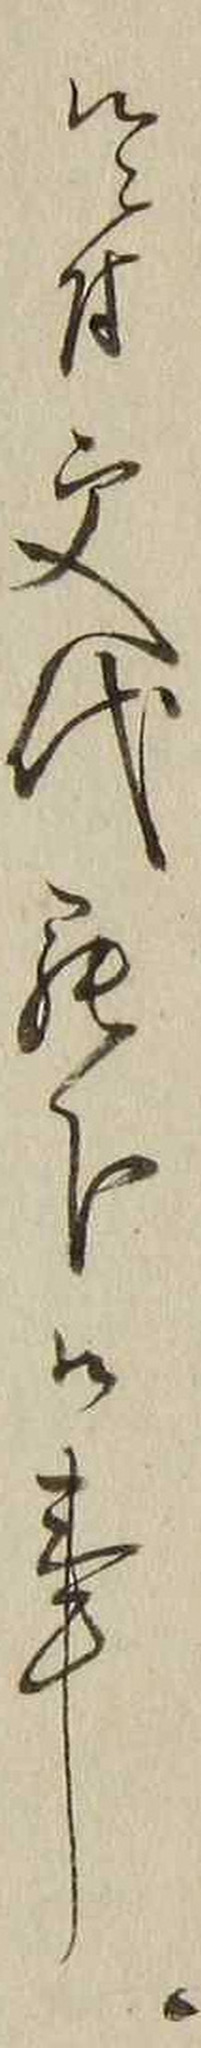候に付更代罷下候事
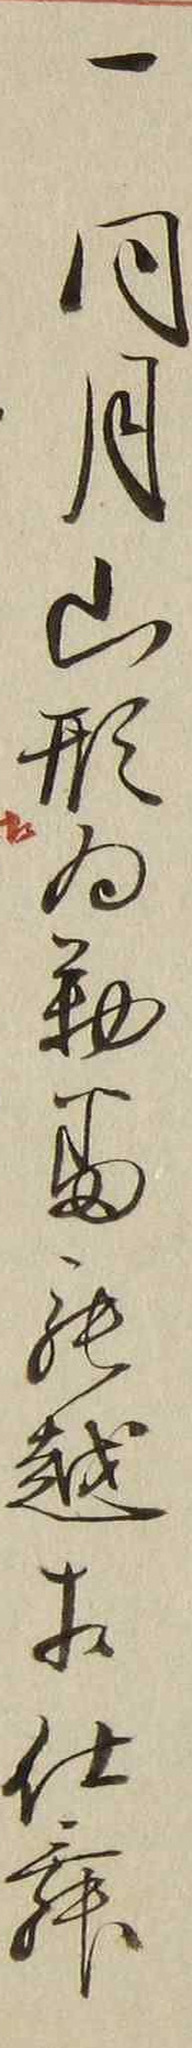一同月山形為勤番罷越相仕舞
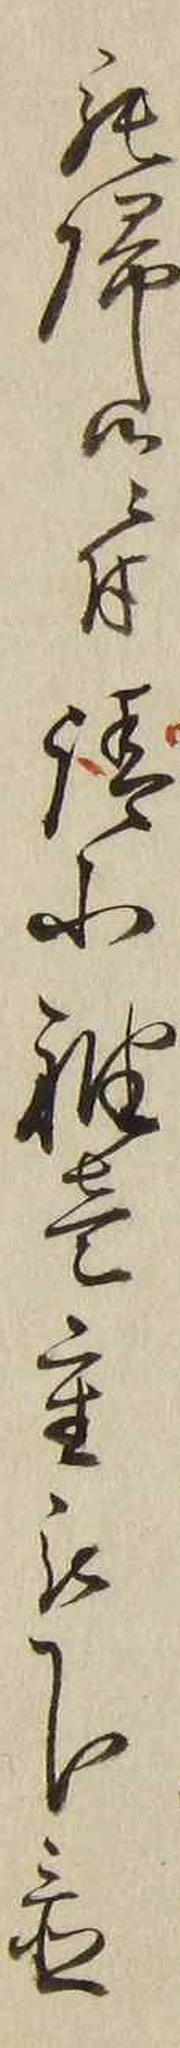罷帰候に付請請小袖壱重被下置

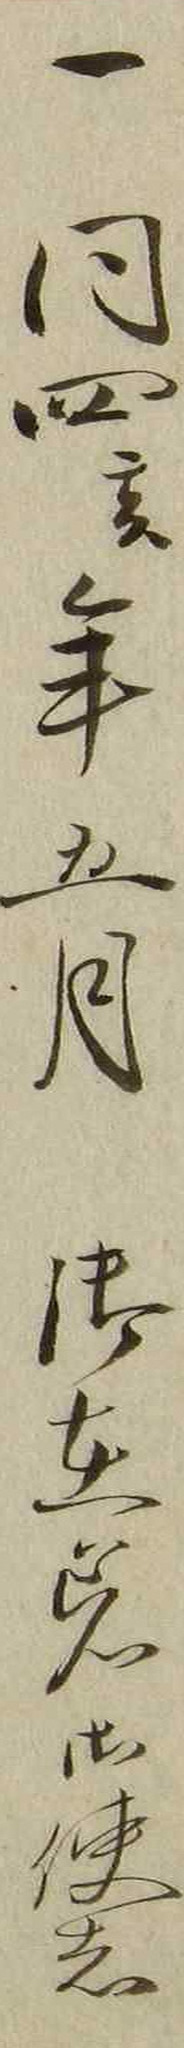一同四亥年五月御在着之御使者
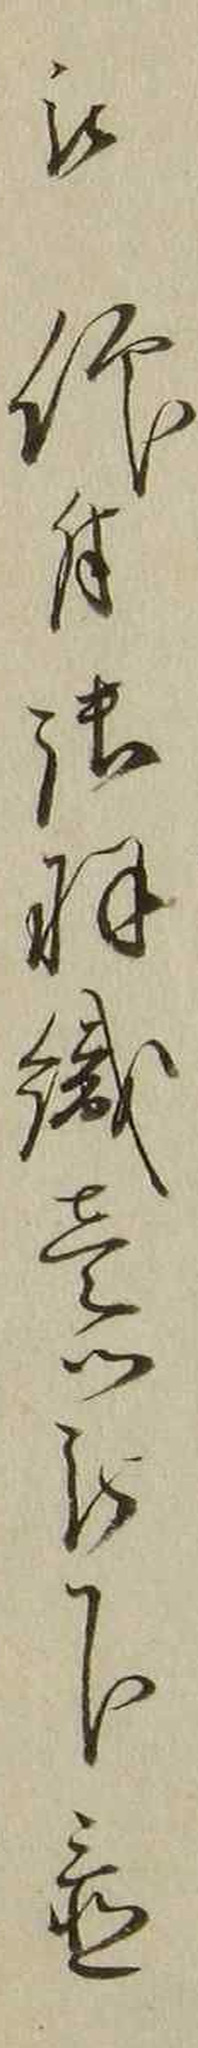被仰付御羽織壱つ被下置
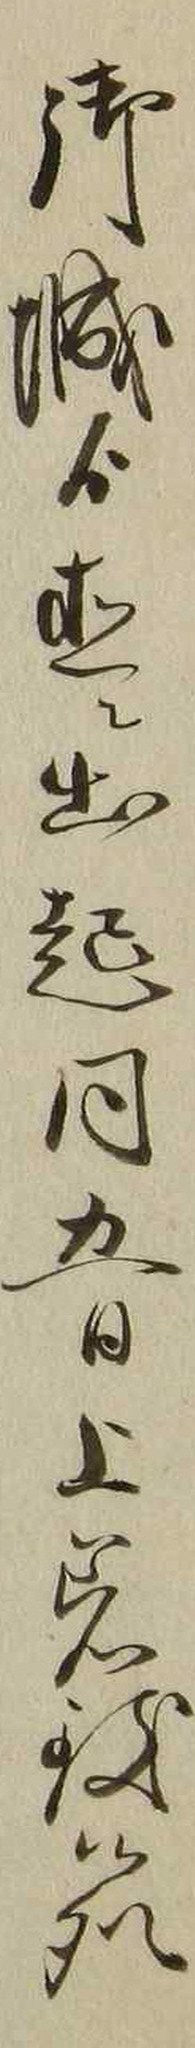御城ゟ直に出起同五日上着致候処
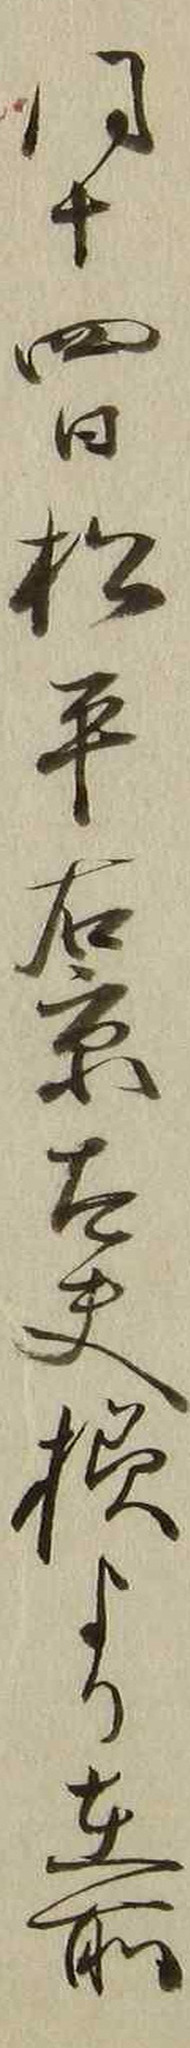同十四日松平右京太夫様より在所
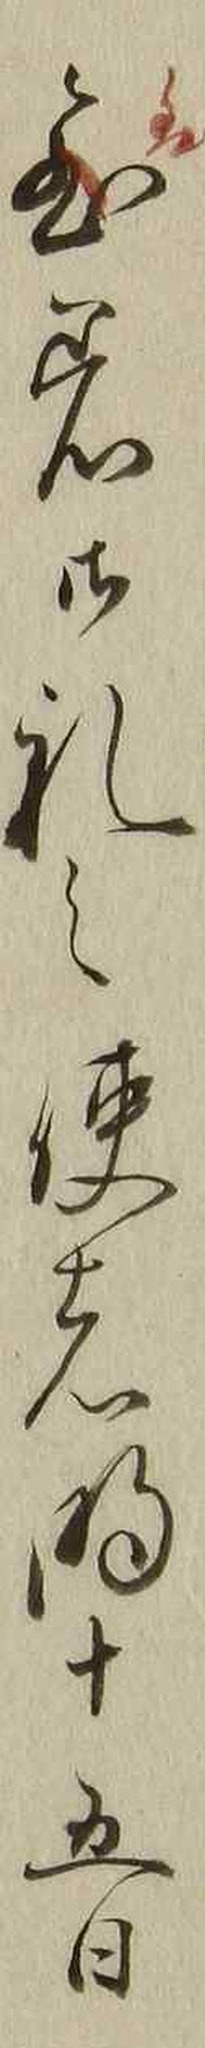至着之御礼之使者明十五日
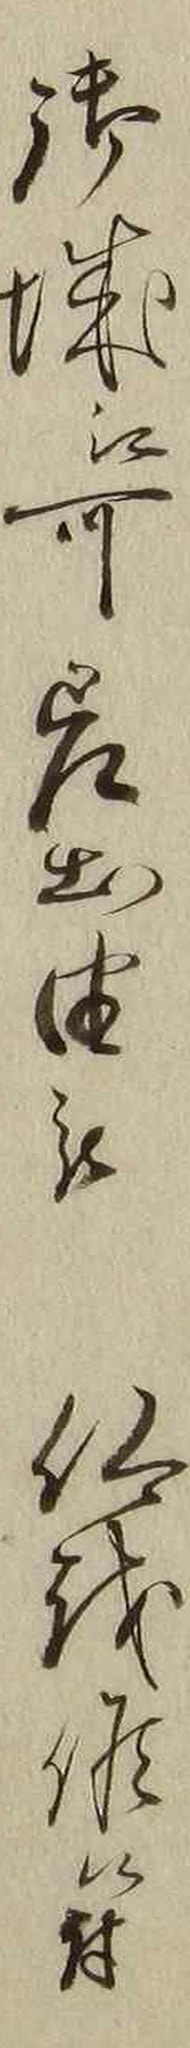御城江可差出由被仰越候付
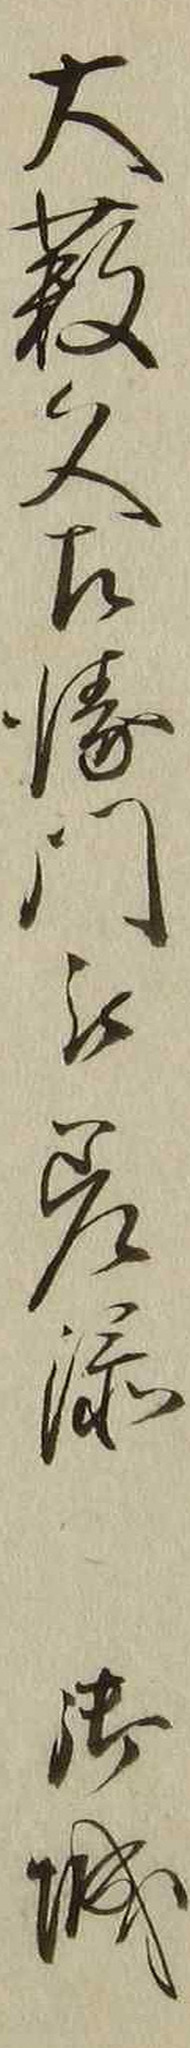大藪久左衛門被差添御城
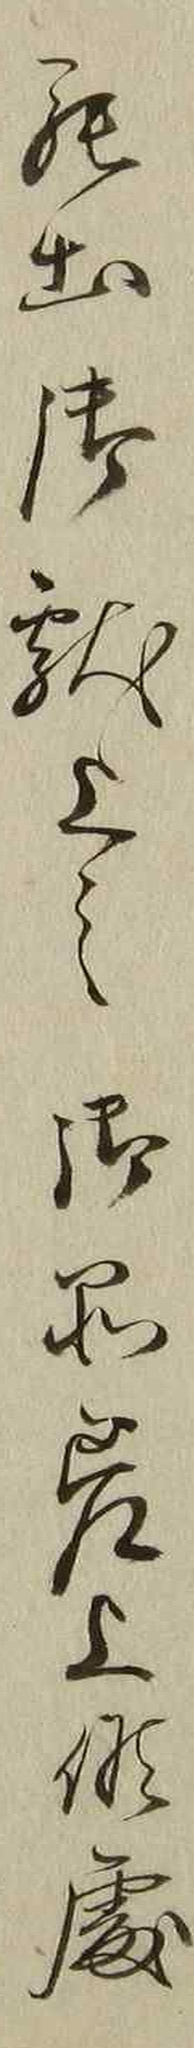罷出御献上之御品差上候処
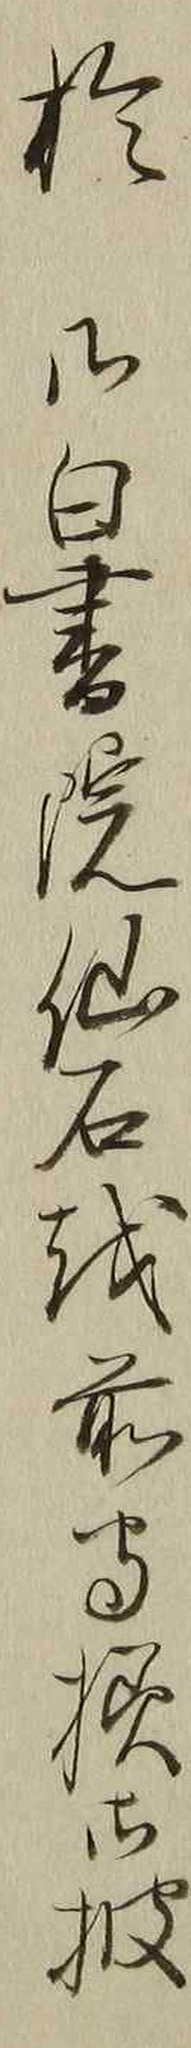於御白書院仙石越前守様御披
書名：諸士系譜　巻之103　か之部11
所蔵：会津若松市立会津図書館
